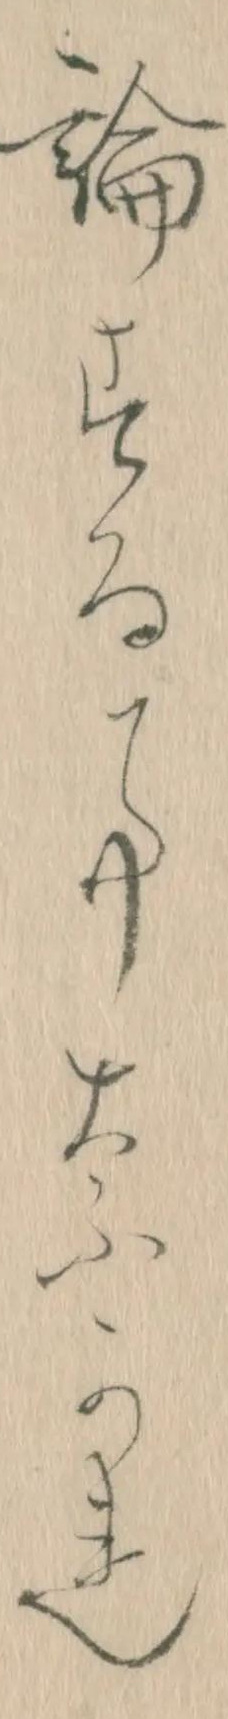論する事なかれ
